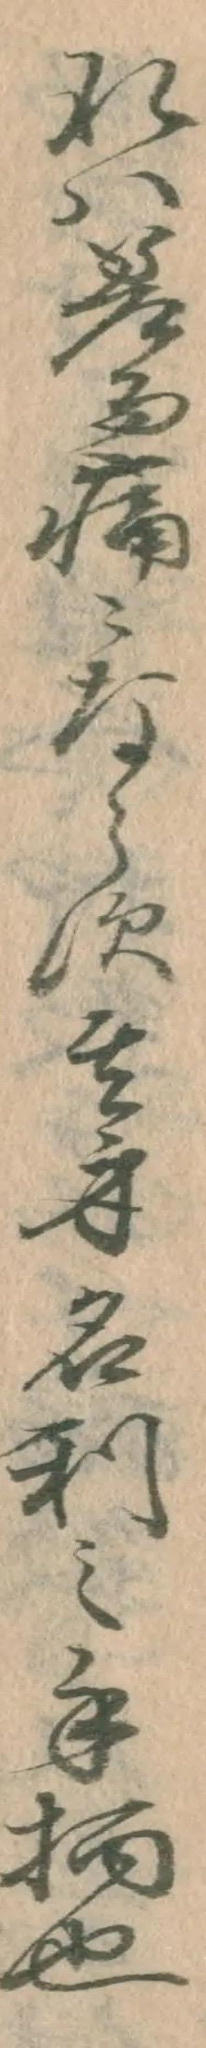れは差而痛になら須其身名利之手柄也
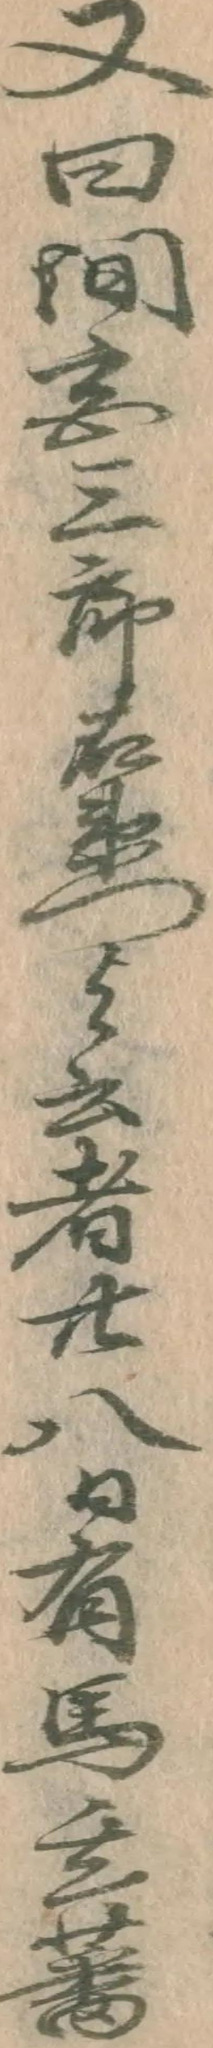又曰間宮三郎右衛門与云者共廿八日有馬玄蕃
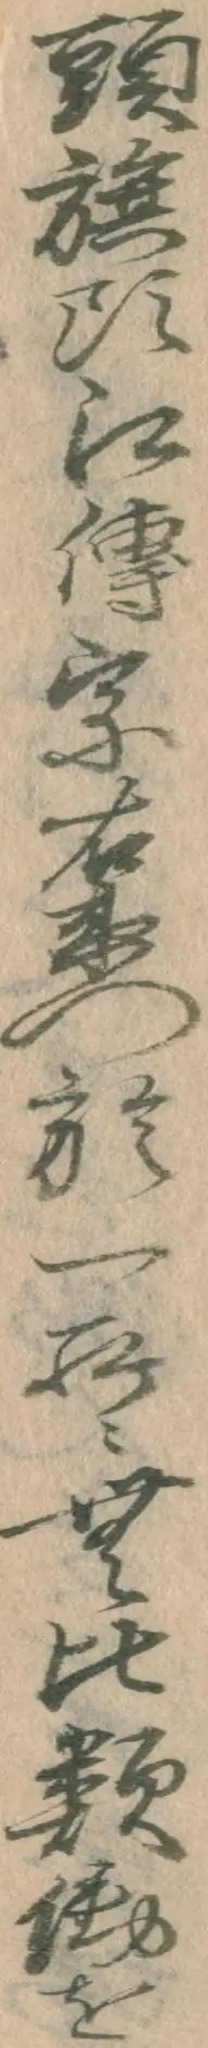頭旗頭江出伝宗右衛門於一所に無比類働を
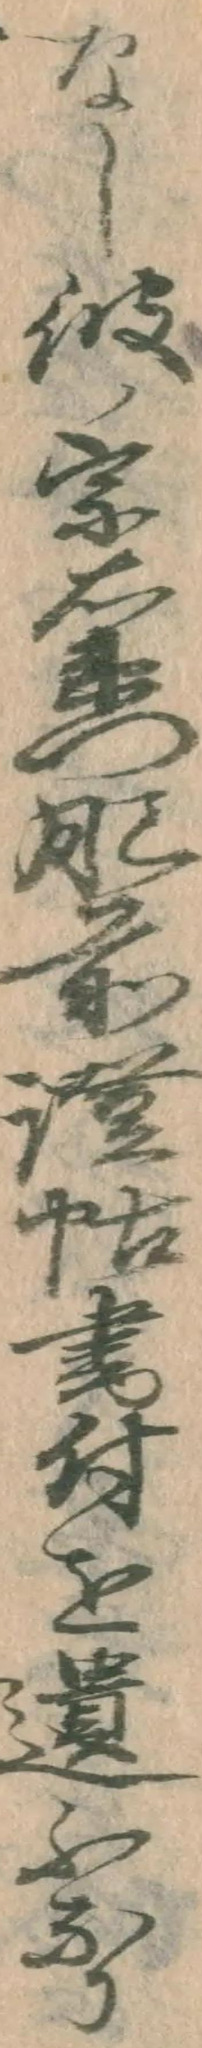なし彼之宗右衛門肥前證帳書付を遺ふなり
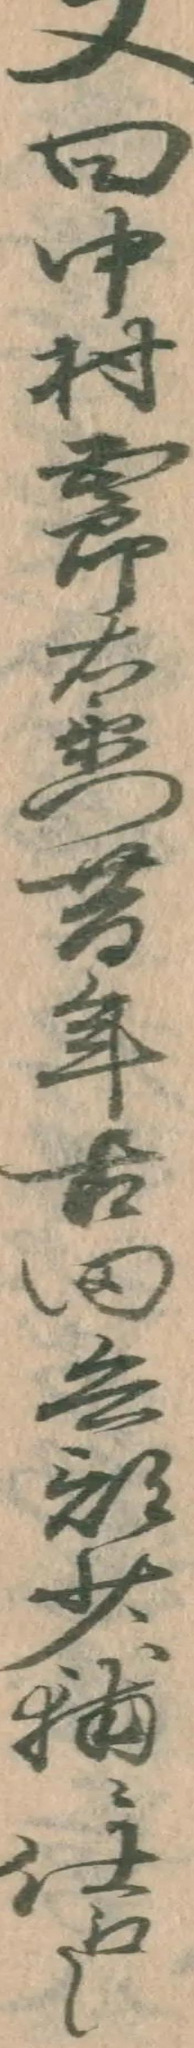又曰中村五郎右衛門昔年古田兵部少輔に仕江し
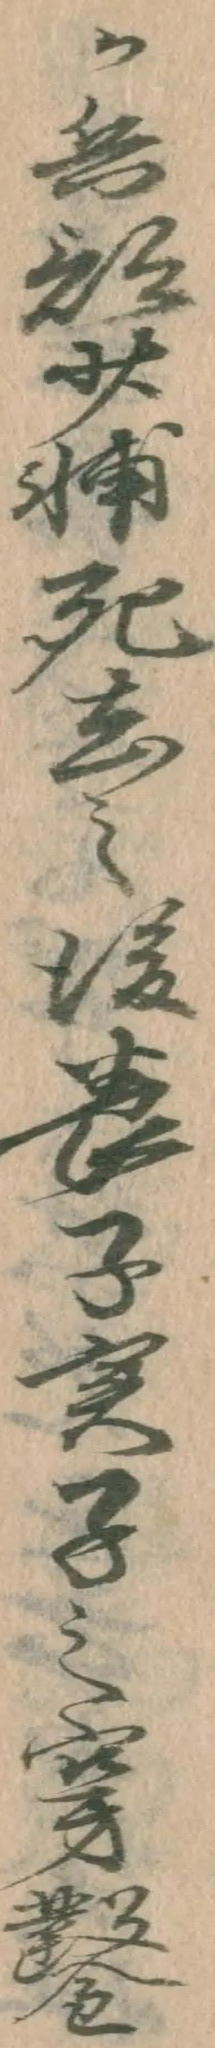か兵部少輔死去之後養子実子之穿鑿
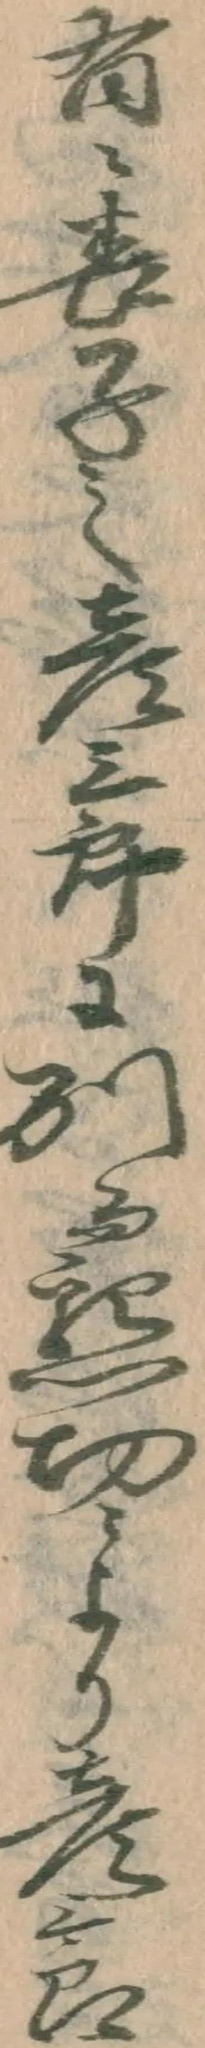有に養子之彦三郎尓別而懇切により彦三郎
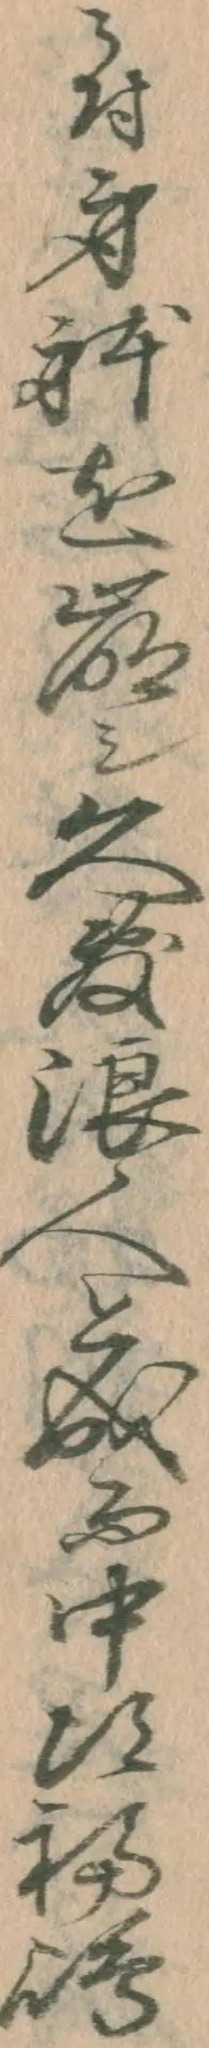に付身躰を崩し久敷浪人と成而中頃福島
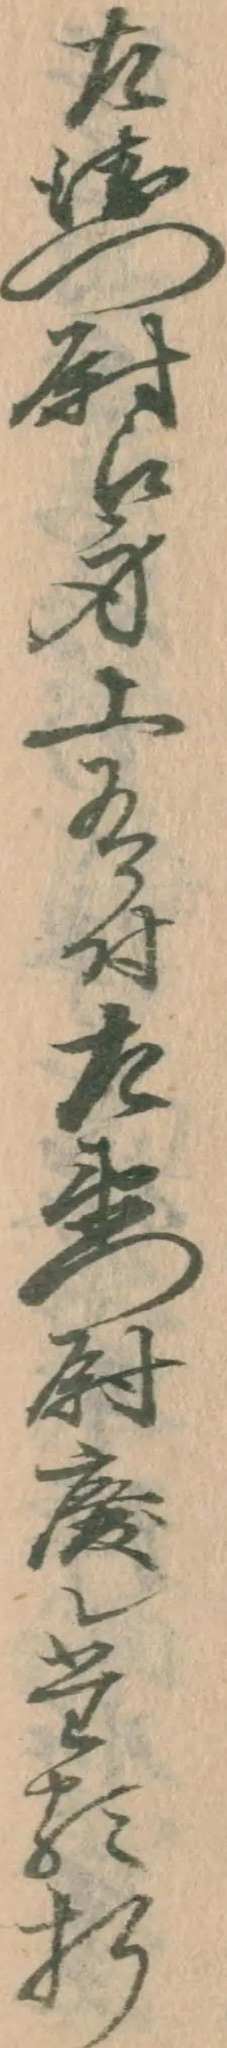左衛門尉江身上有付左衛門尉廃し堂類折
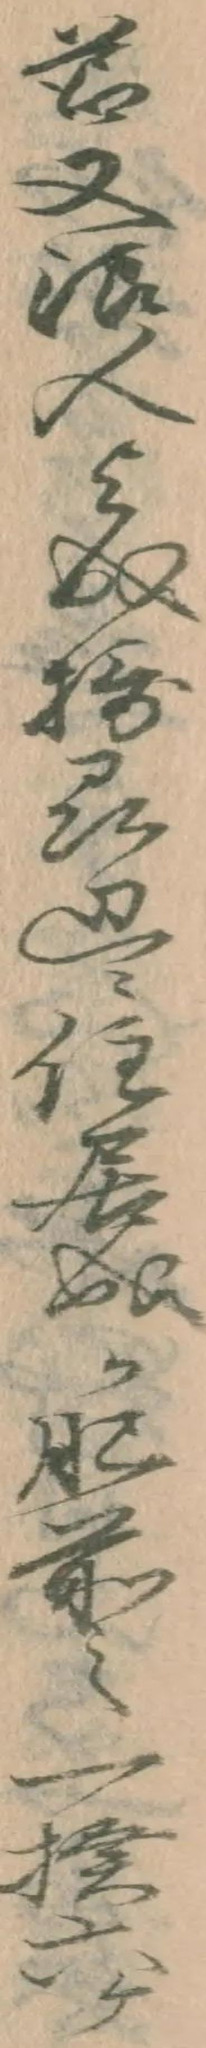節又浪人与成摂州辺に住居成か肥前之一揆六け
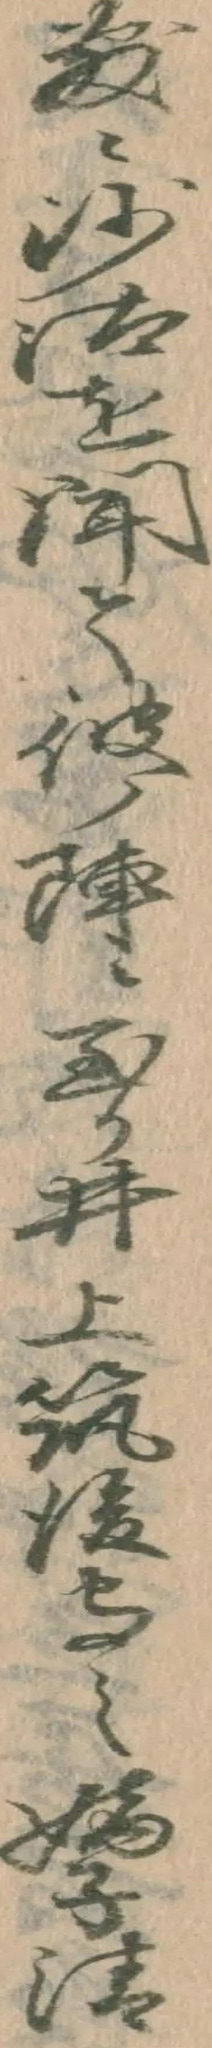敷に沙汰を聞て彼之陣に至り井上筑後守之嫡子清
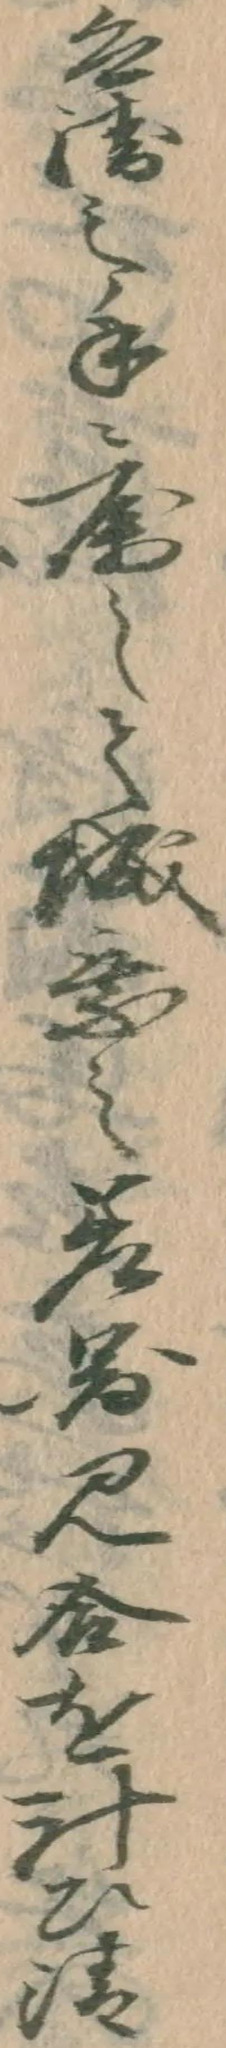兵衛之手に属して城乗之差図見合を計ひ清
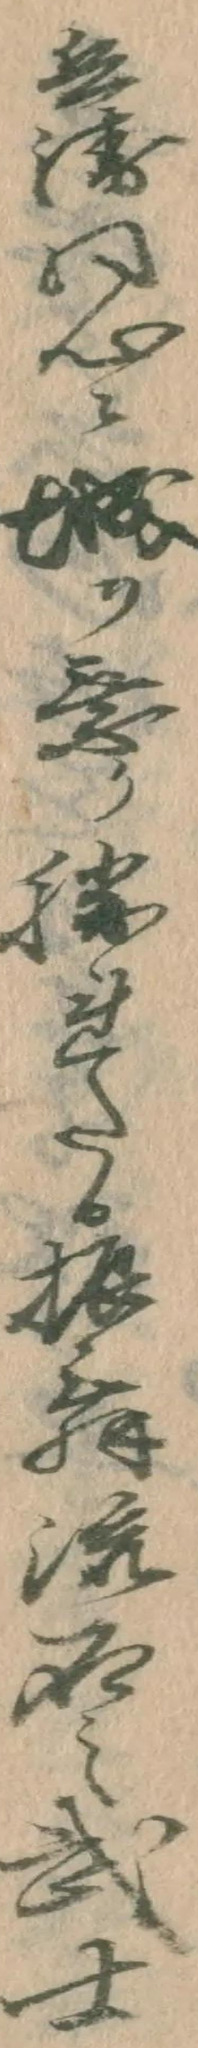兵衛同心に城を乗り勝連たる振舞流石之武士
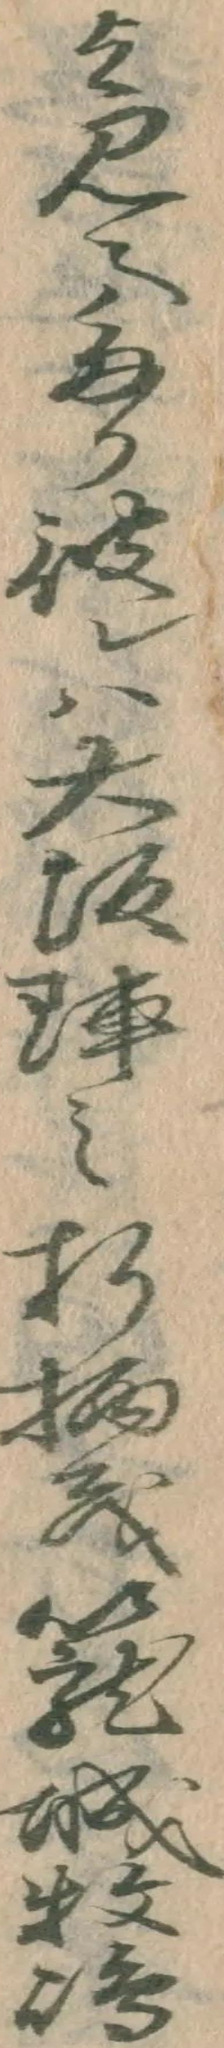与見へ多り彼れは大坂陣之折柄茂籠城牧島
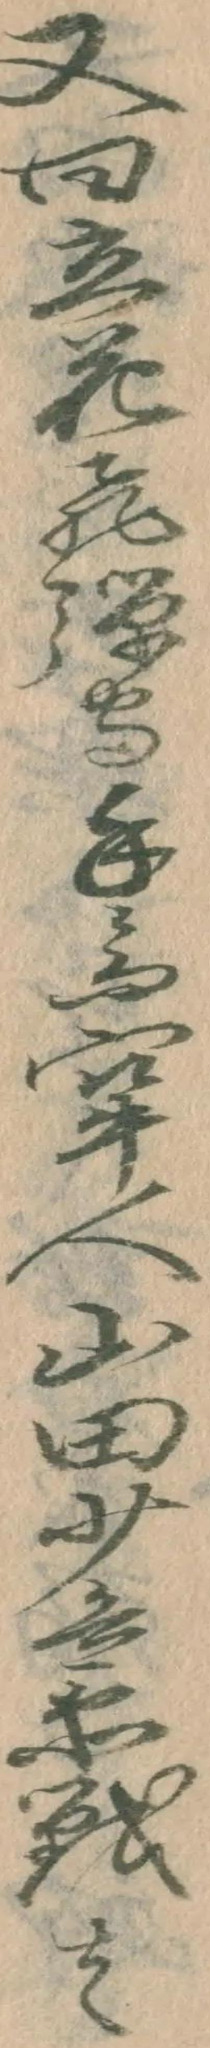又曰立花飛騨守手に而牢人山田少兵衛戦者
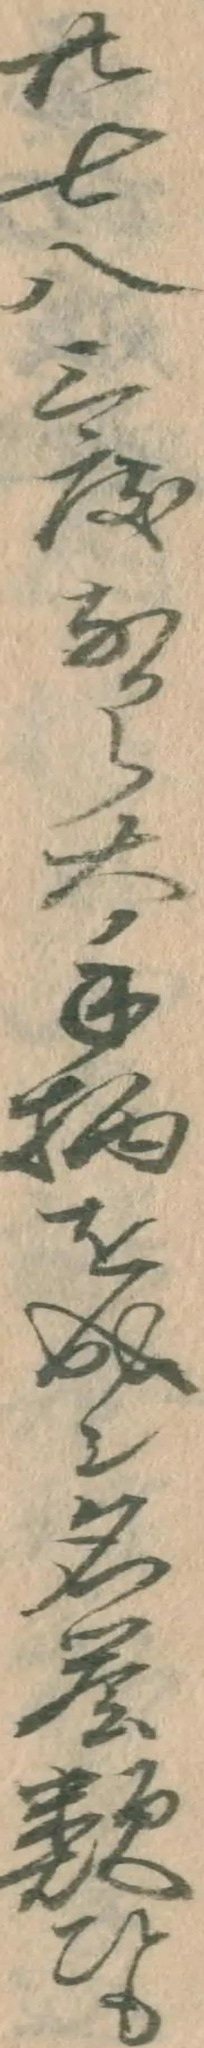廿七八三度なから大手柄を成し名誉歓ひも
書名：切支丹御退治記 49巻. [8]
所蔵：国立国会図書館 National Diet Library, JAPAN
